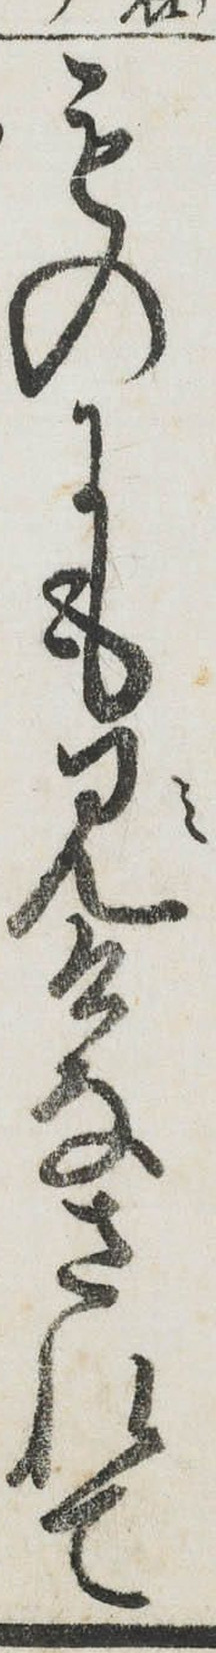ものにも見けなされて
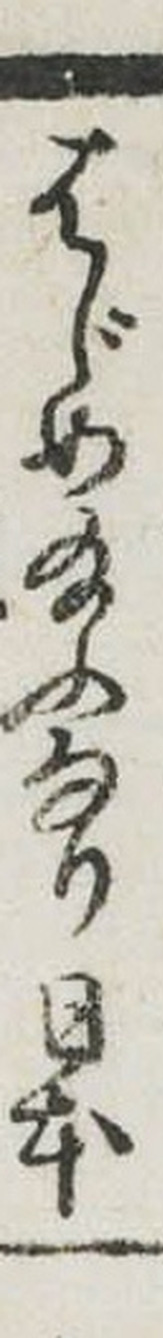はじめ給ふなり日本
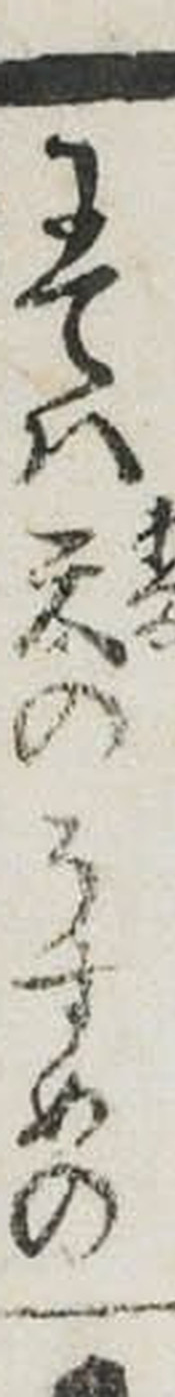にては天のうすめの
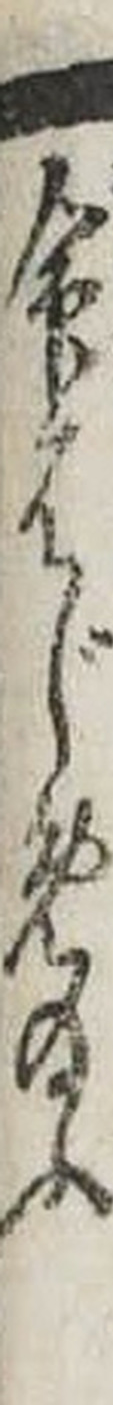命はじめ給ふ
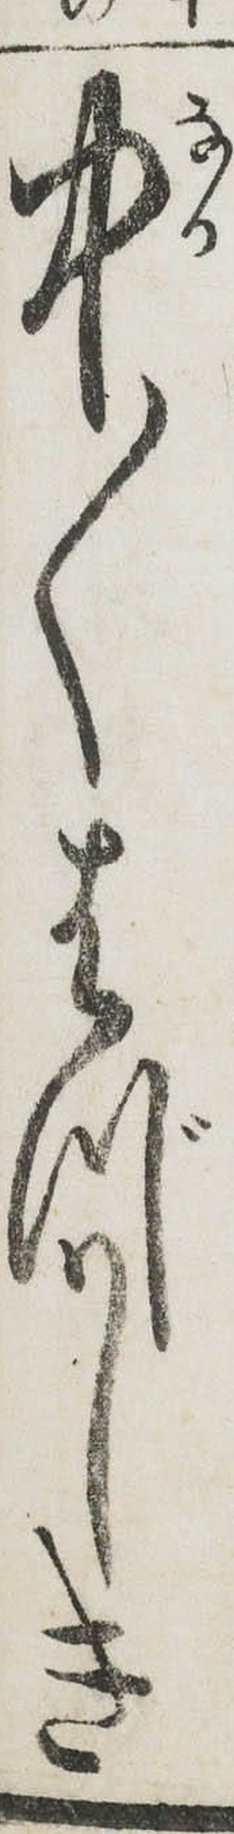中〳〵はづかしき
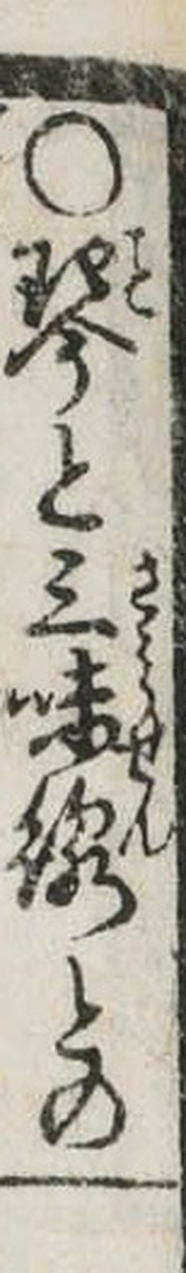○琴と三味線との
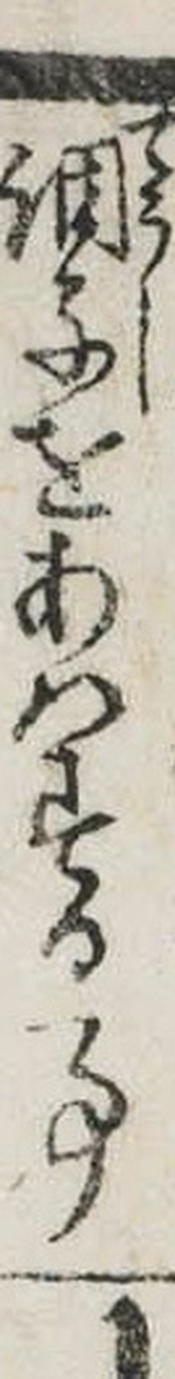調子をあはする事
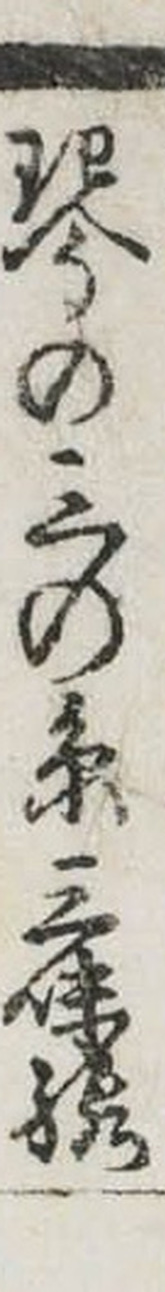琴の三の糸三味線
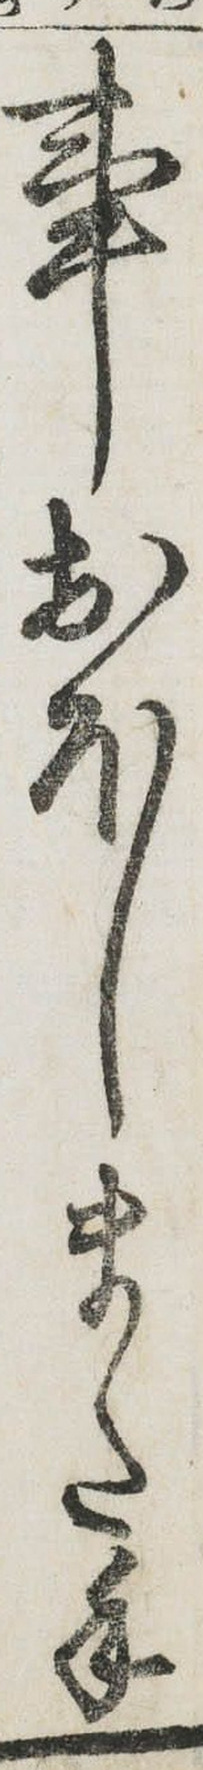事おほしまた手
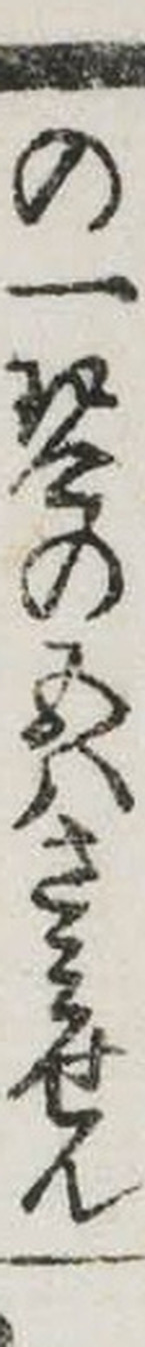の一琴の五はさみせん
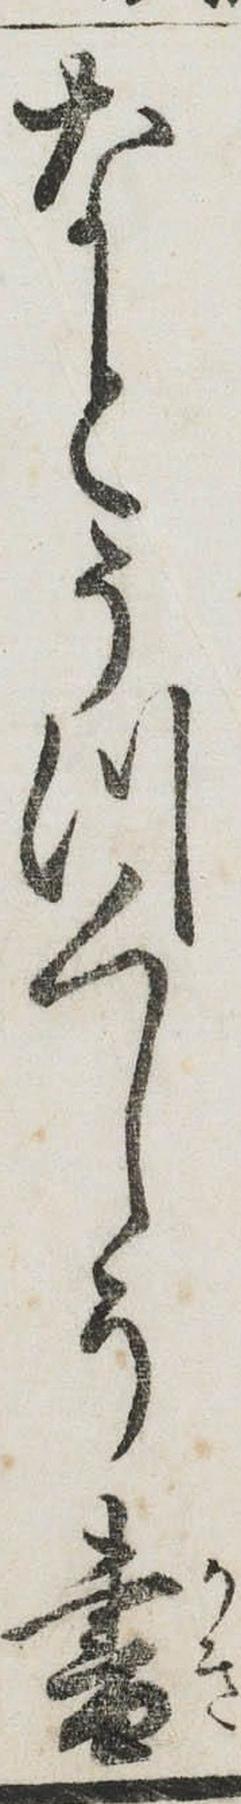なとうつくしう書
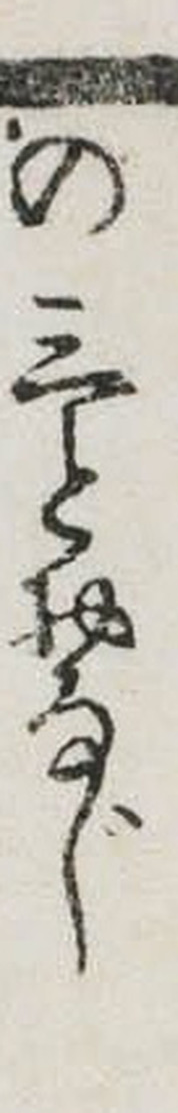の三とおなじ
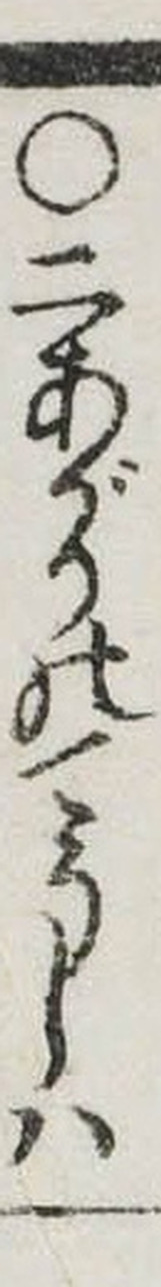○二あがりのてうしは
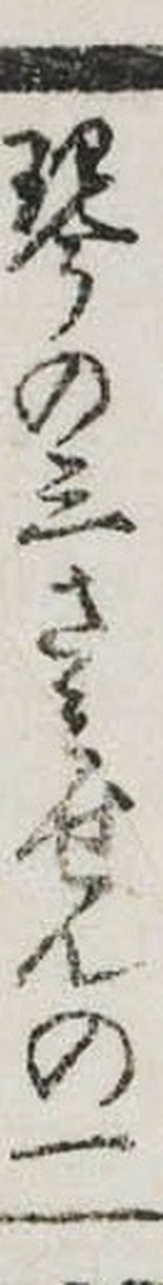琴の三さみせんの一
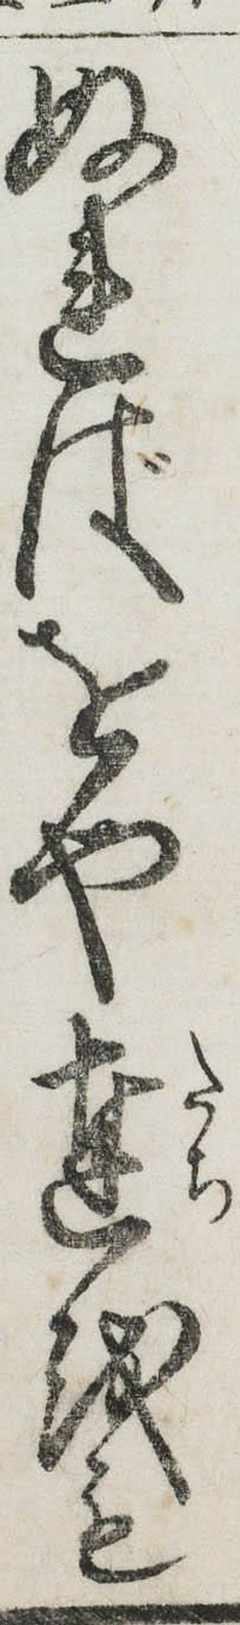ぬればをや達をも
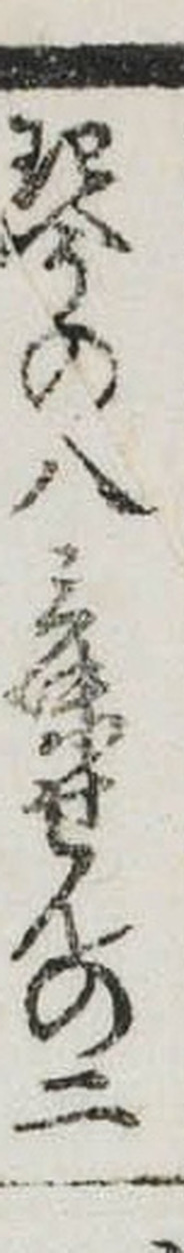琴の八三味せんの二
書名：頭書萬用婦人手紙之文言
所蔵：東京学芸大学教育コンテンツアーカイブ
